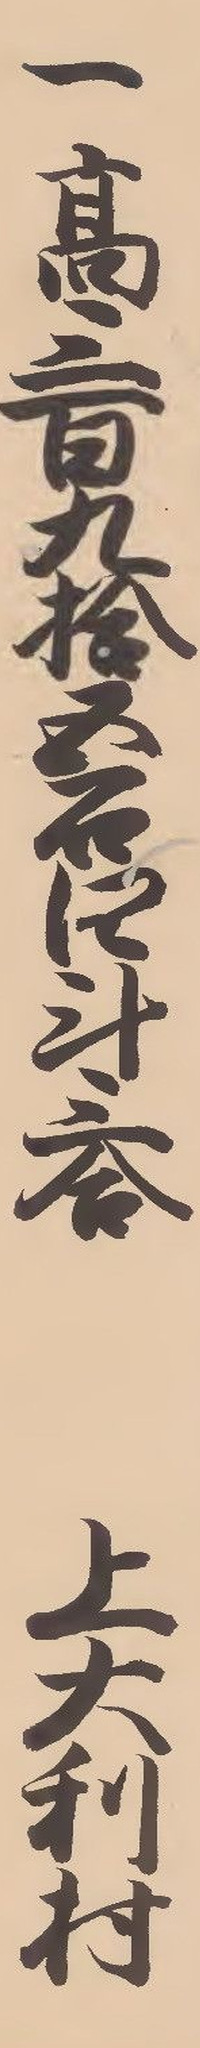一高三百九拾五石四斗三合上大利村
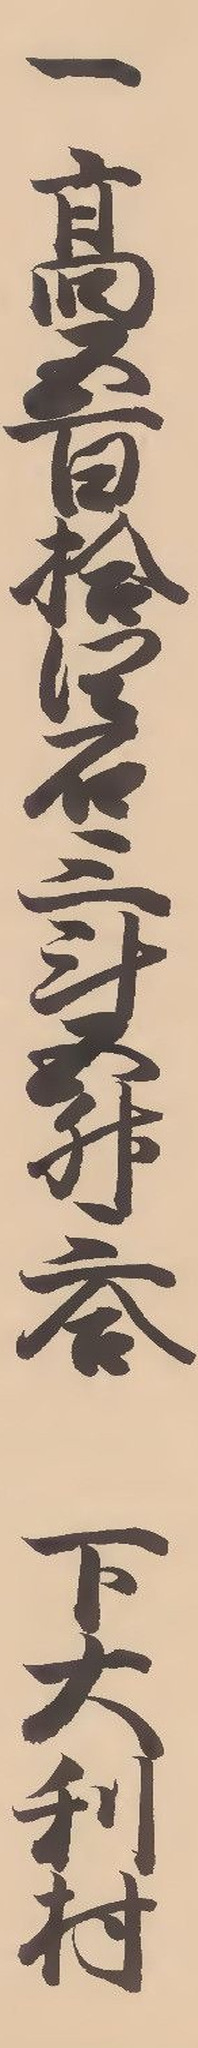一高五百拾四石三斗五升三合下大利村
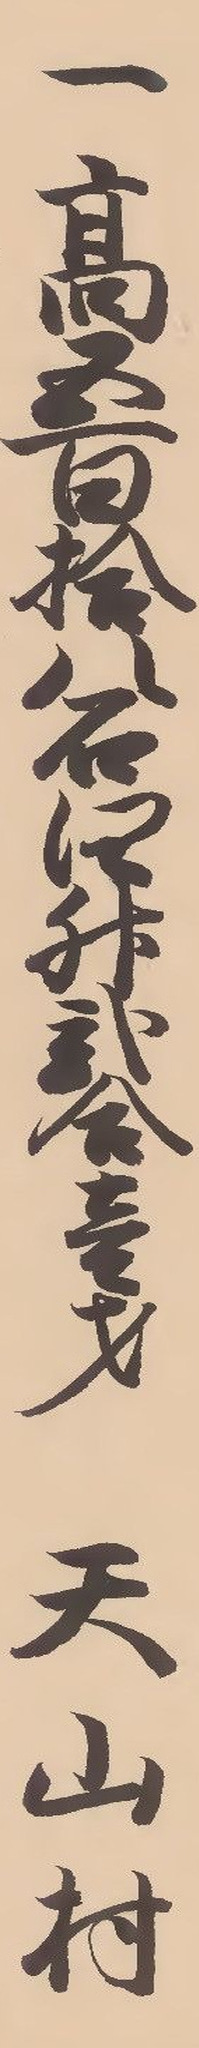一高五百拾八石四升弐合壱才天山村
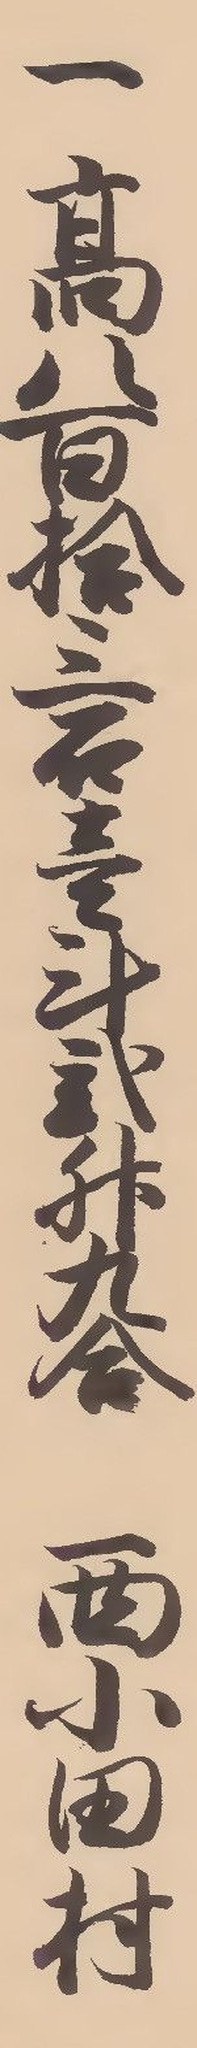一高八百拾三石壱斗弐升九合西小田村

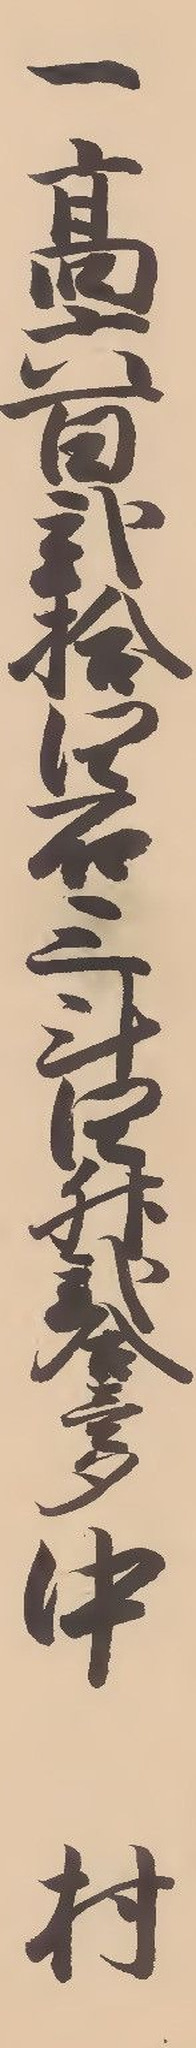一高六百弐拾四石三斗四升弐合壱勺中村
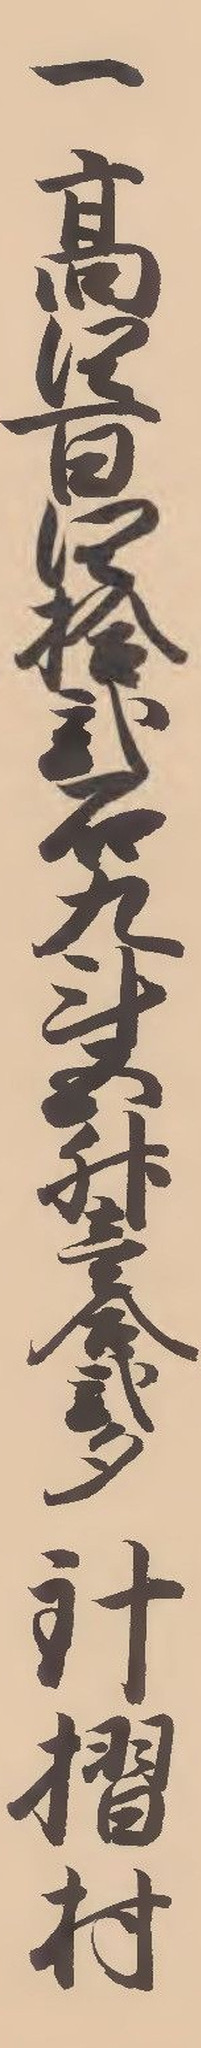一高四百四拾弐石九斗五升壱合弐勺針摺村
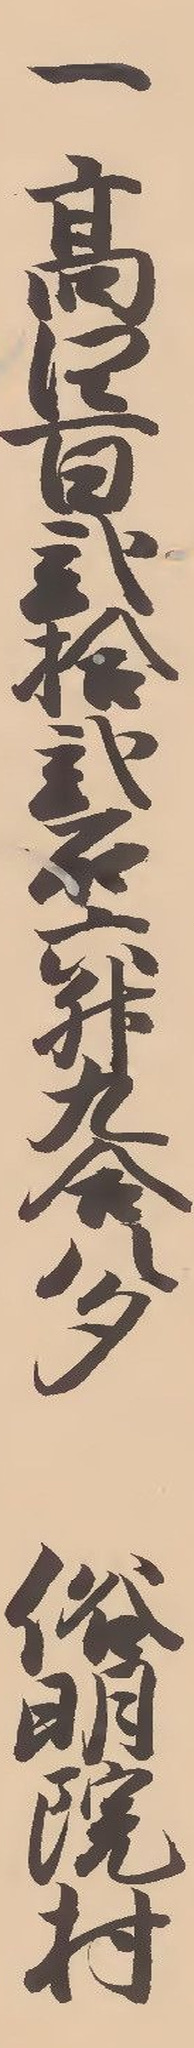一高四百弐拾弐石六升九合八勺俗明院村
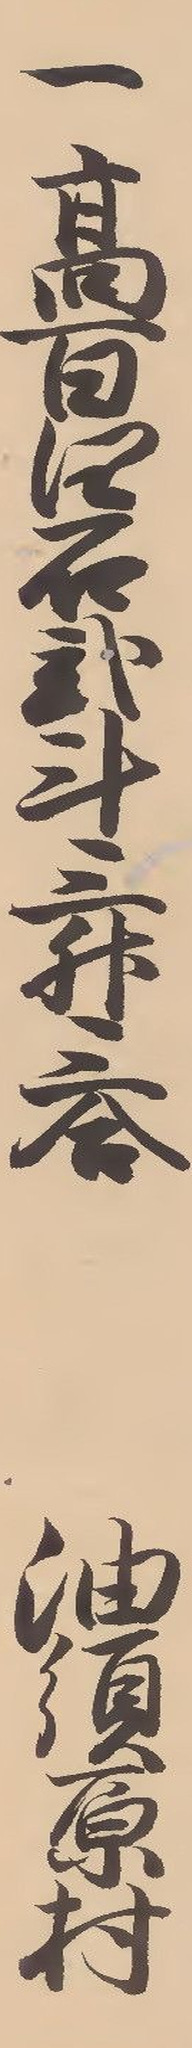一高百四石弐斗三升三合油須原村
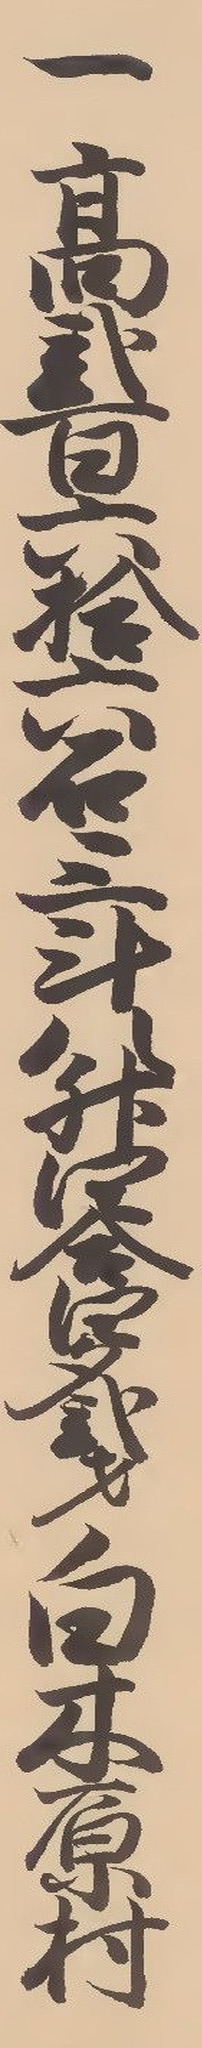一高弐百六拾六石三斗八升四合四勺弐才白木原村
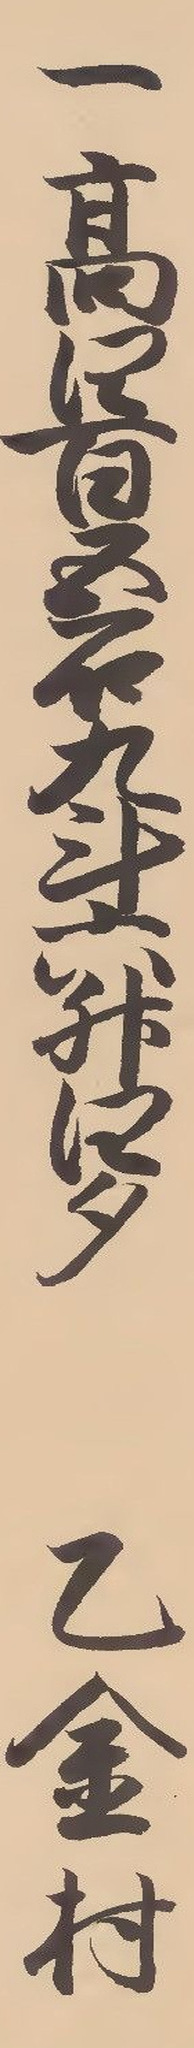一高四百五石九斗六升四勺乙金村
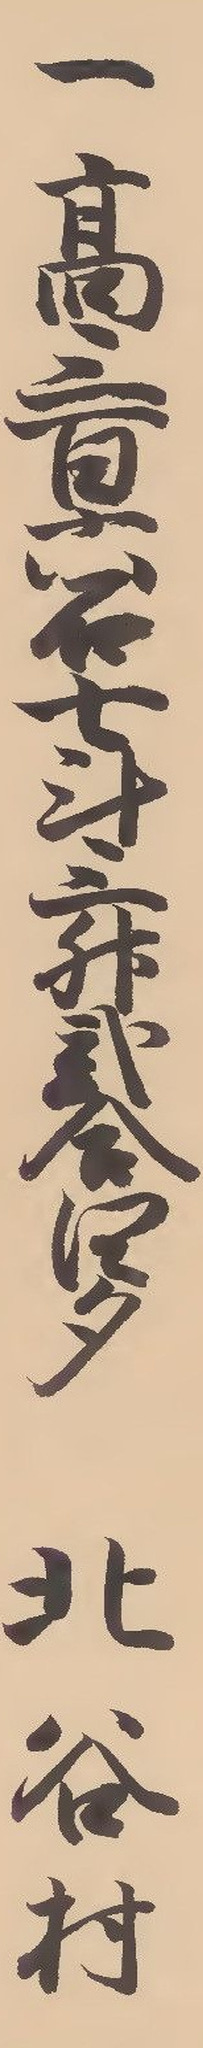一高三百六石七斗三升弐合四勺北谷村

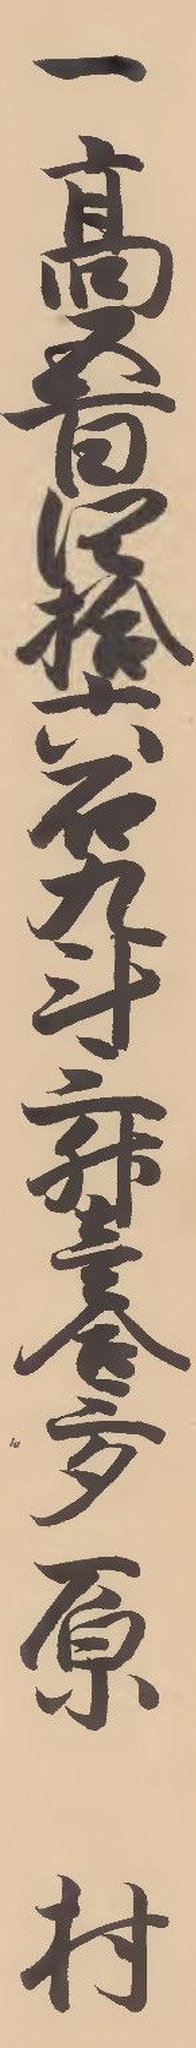一高五百四拾六石九斗三升壱合三勺原村
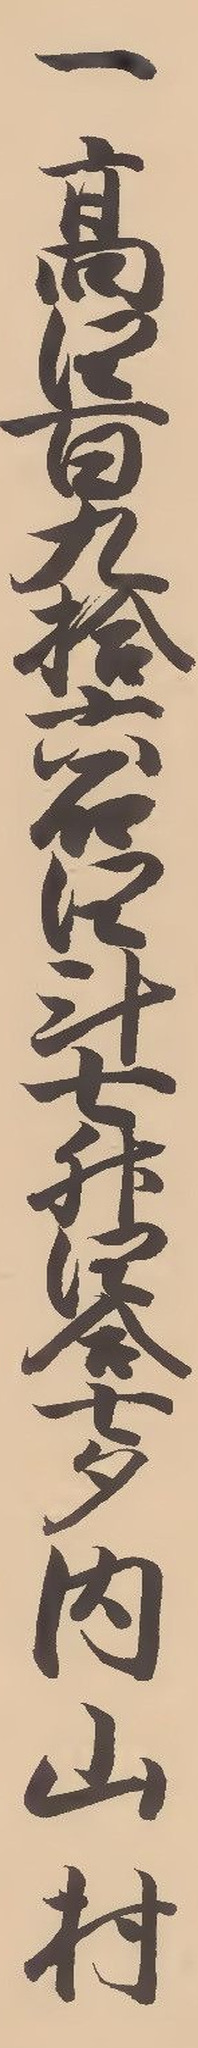一高四百九拾六石四斗七升四合七勺内山村
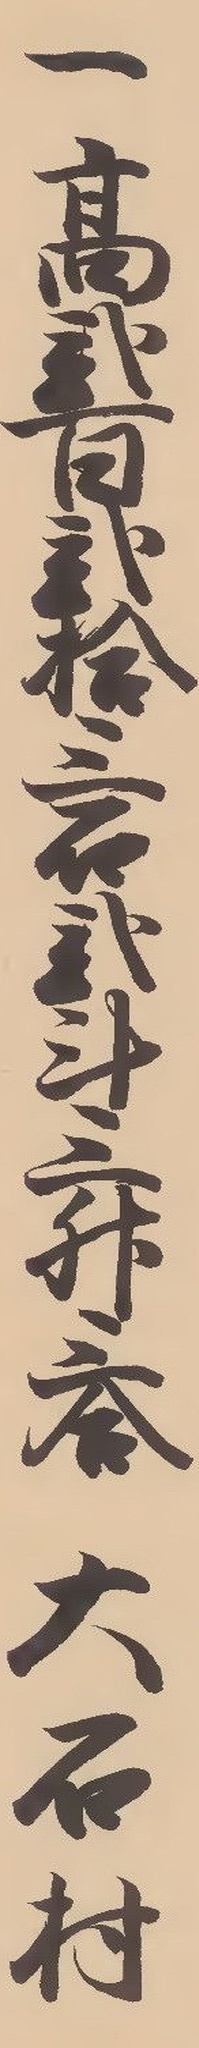一高弐百弐拾三石弐斗三升三合大石村
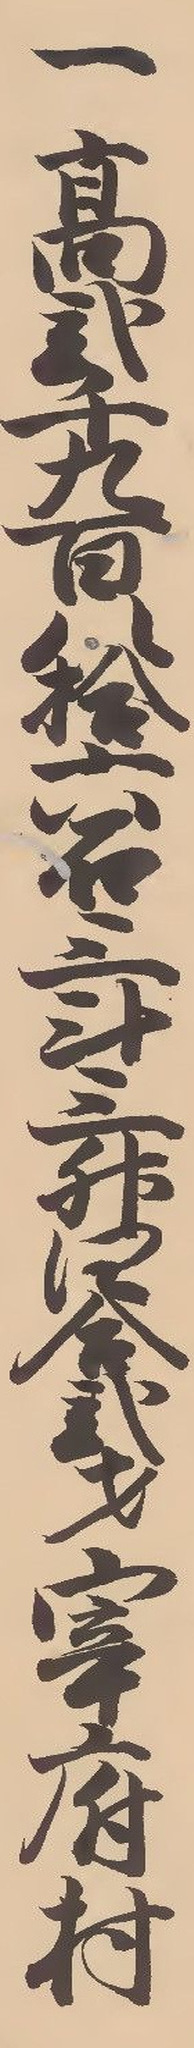一高弐千九百八拾六石三斗三升四合弐才宰府村
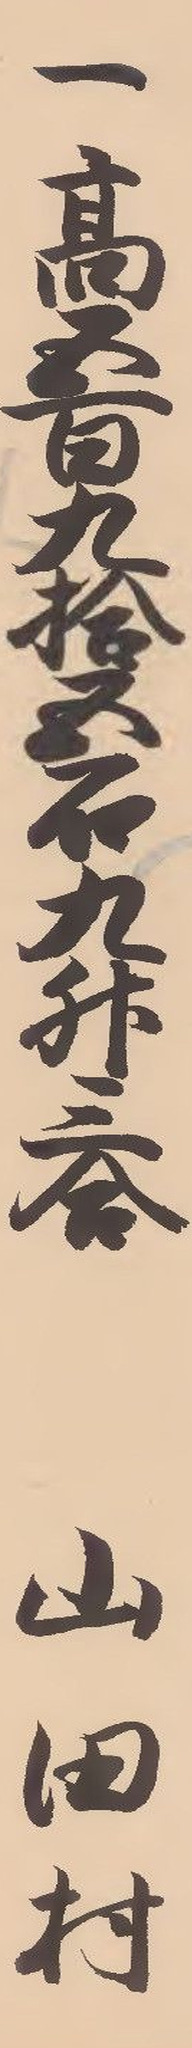一高五百九拾五石九升三合山田村
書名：筑前国郷帳
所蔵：国立公文書館 National Archives of Japan
